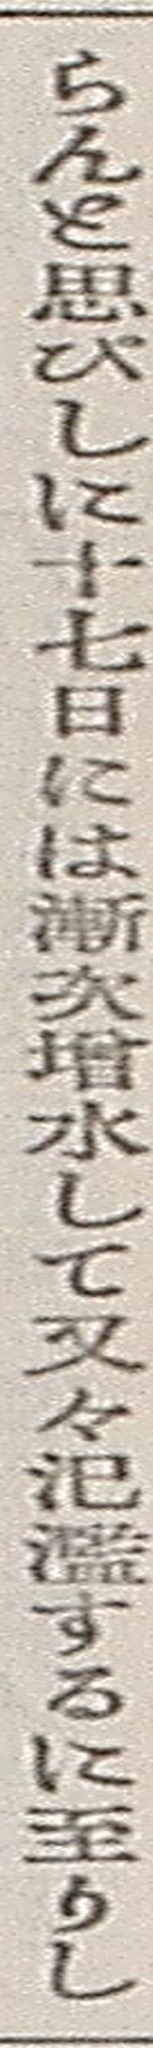らんと思ひしに十七日には漸次増水して又々氾濫するに至りし
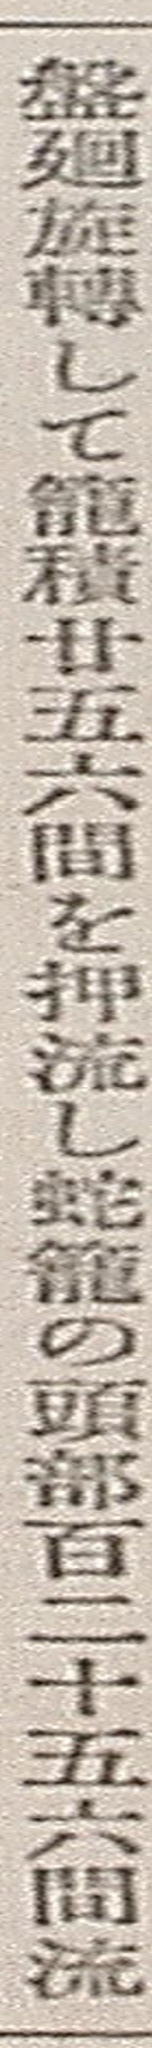盤廻旋転して籠積廿五六間を押流し蛇籠の頭部百二十五六間流
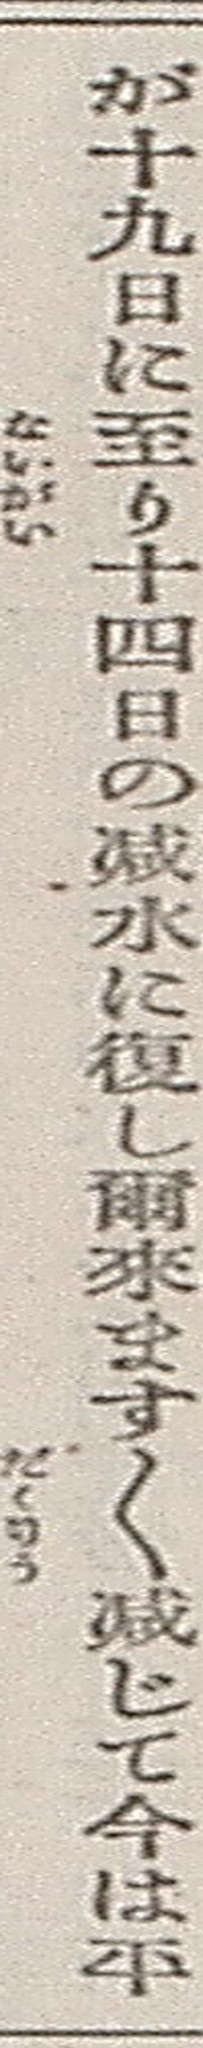が十九日に至り十四日の減水に復し爾来ます〳〵減じて今は平
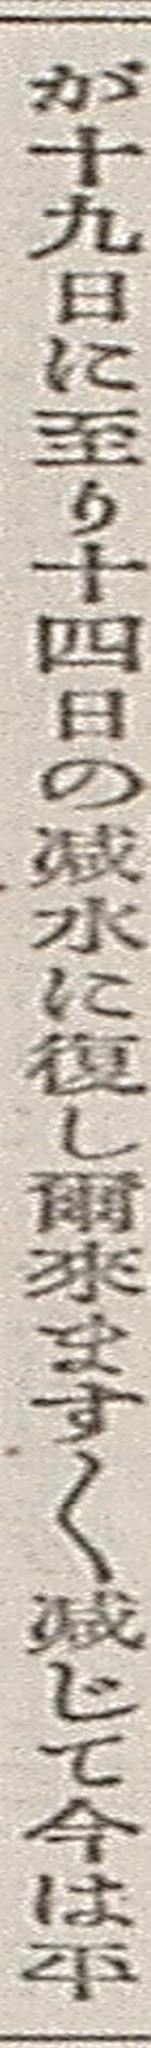が十九日に至り十四日の減水に復し爾来ます〳〵減じて今は平
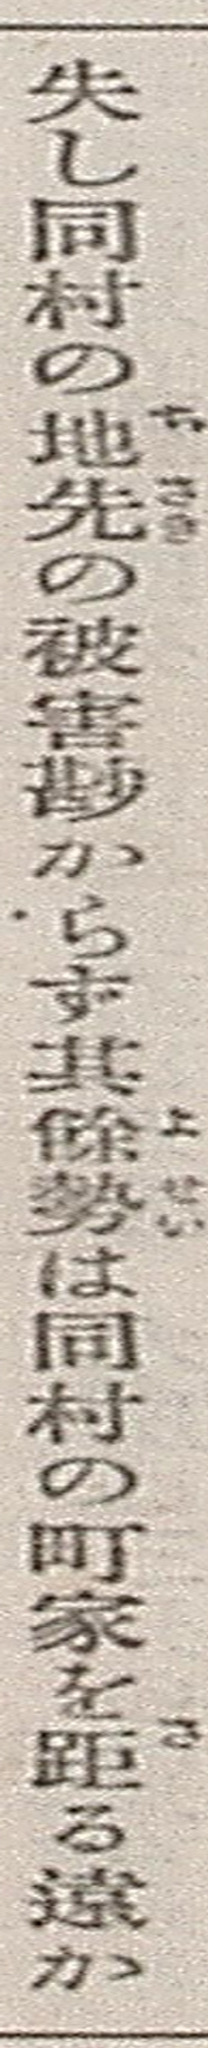失し同村の地先の被害少なからず其余勢は同村の町家を距る遠か
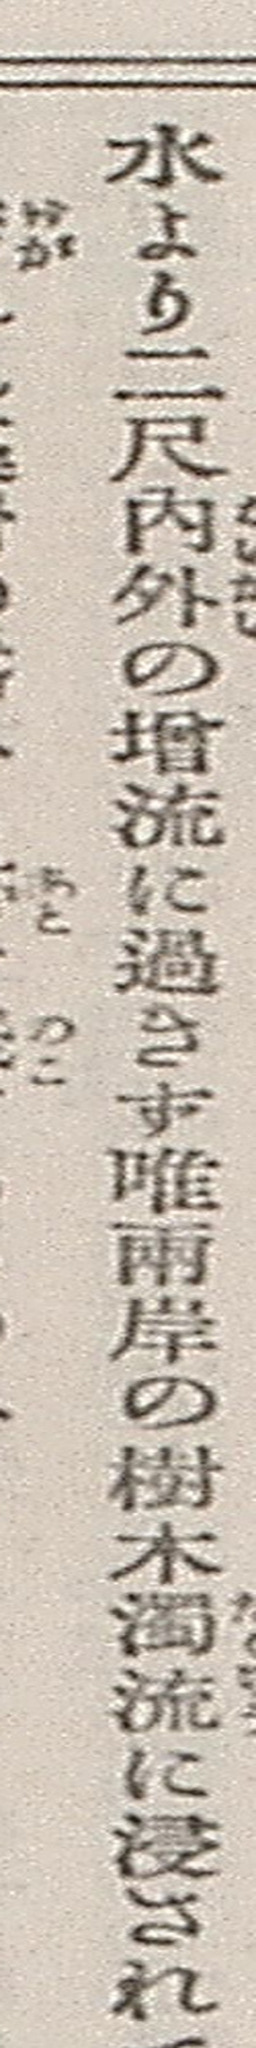水より二尺内外の増流に過きず唯両岸の樹木濁流に浸されて白
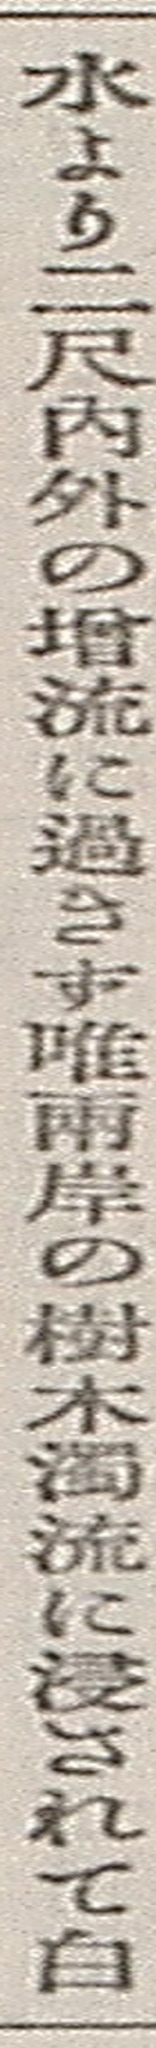水より二尺内外の増流に過きず唯両岸の樹木濁流に浸されて白
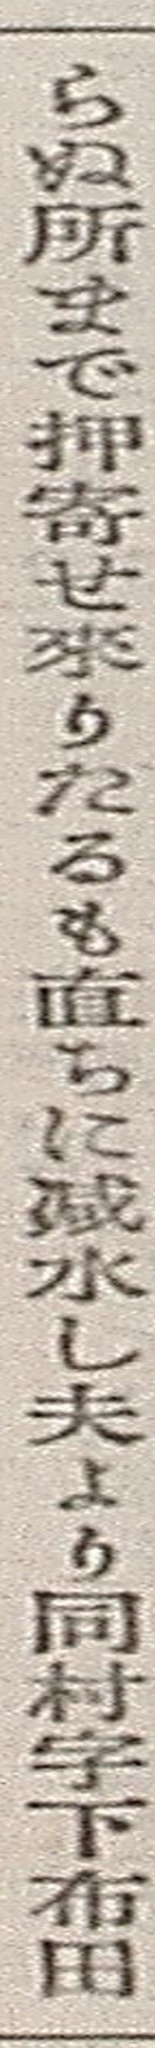らぬ所まで押寄せ来りたるも直ちに減水し夫より同村下布田
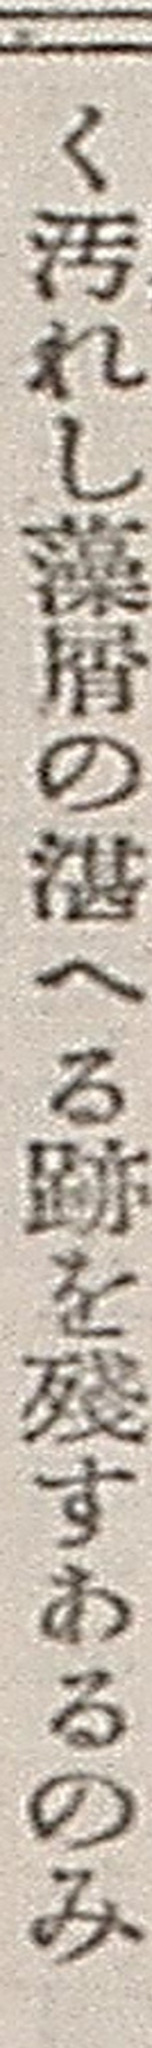く汚れし藻屑の堪へる跡を残すあるのみ
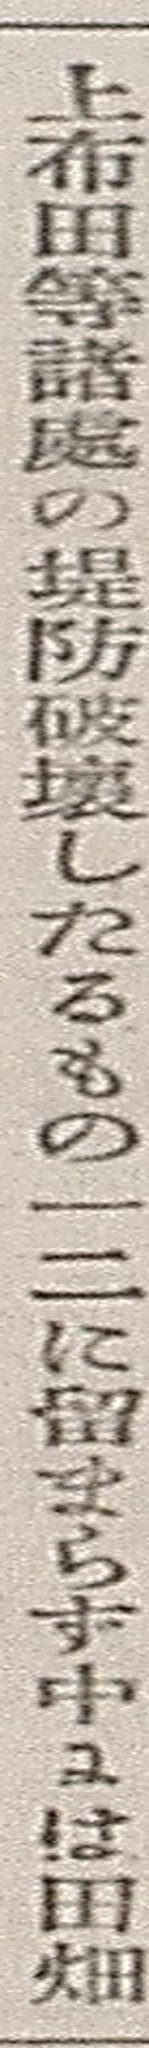上布田等諸処の堤防破壊したるもの一二に留まらず中には田畑
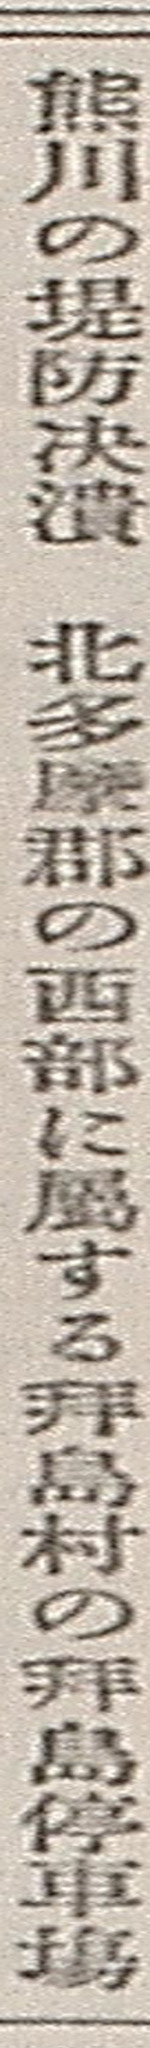熊川の堤防決潰北多摩郡の西部に属する拝島村の拝島停車場
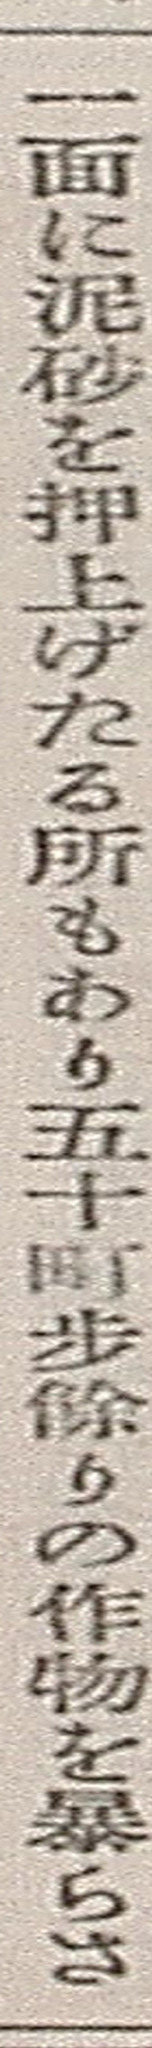一面に泥砂を押上げたる所もあり五十町歩余りの作物を暴らさ
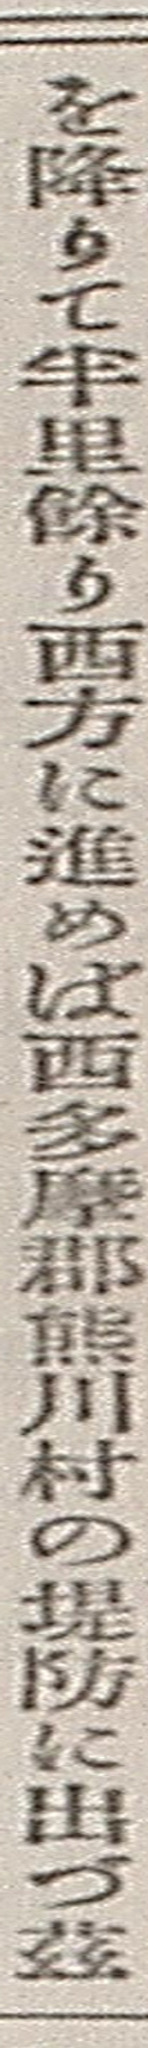を降りて半里余り西方に進めば西多摩郡熊川村の堤防に出づ茲
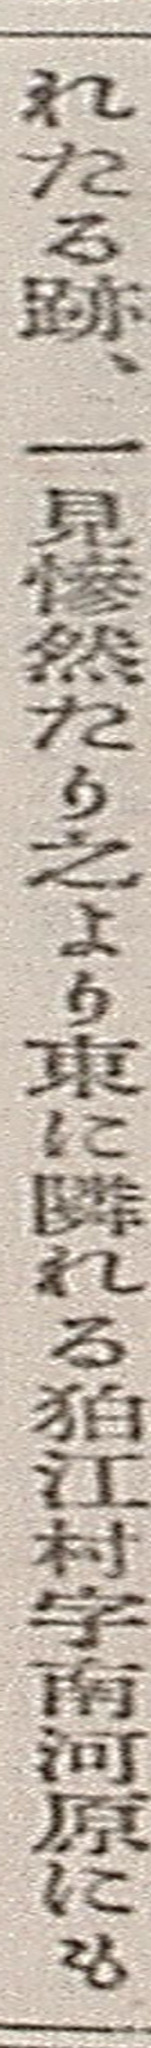れたる跡、一見惨然たり之より東に隣れる狛江村字南河原にも
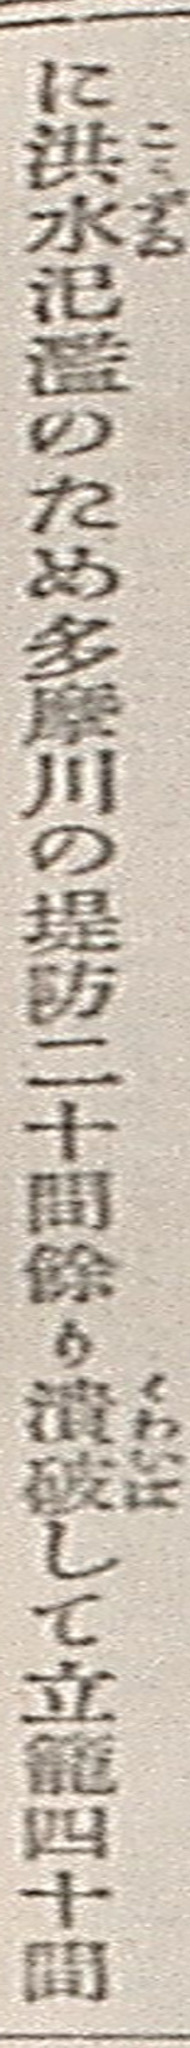に洪水氾濫のため多摩川の堤防二十間余り潰破して立籠四十間
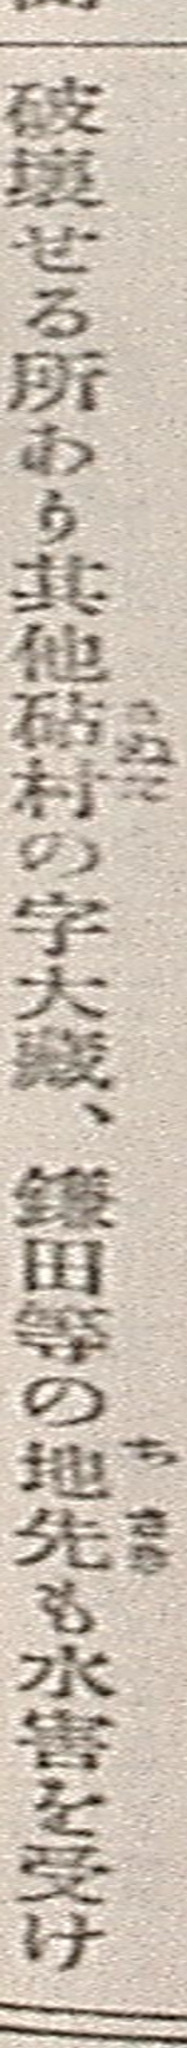破壊せる所あり其他砧村の字大蔵、鎌田等の地先も水害を受け
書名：風俗畫報臨時増刊第百二十四號　洪水地震被害録（上）
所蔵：東京大学地震研究所図書室 Earthquake Research Institute Library, The University of Tokyo, JAPAN
